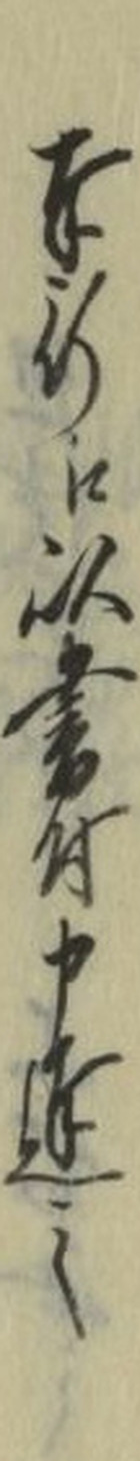奉行え以書付申達之
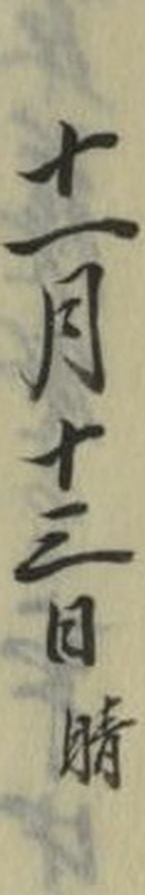十一月十三日晴

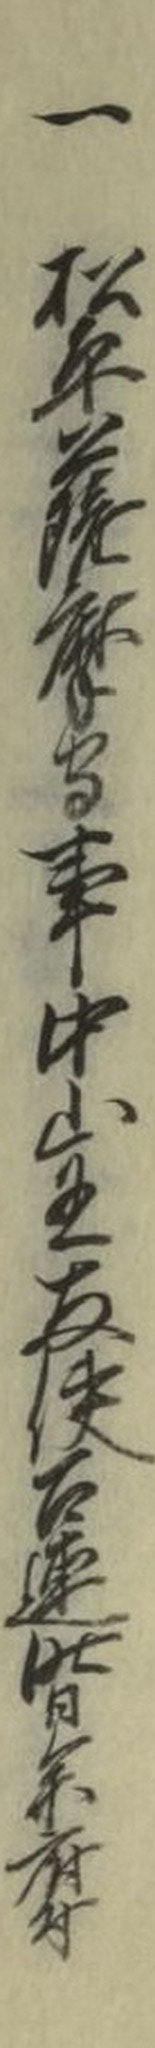一松平薩摩守事中山王両使召連昨日参府付
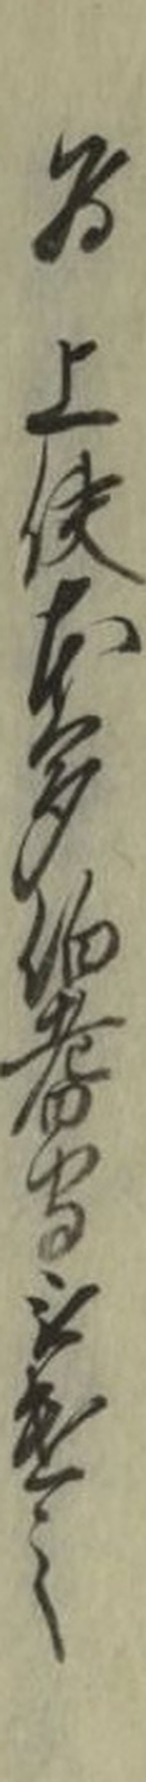為上使本多伯耆守被遣之
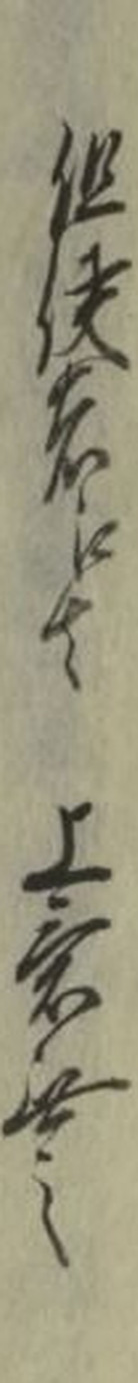但使者えは上意無之
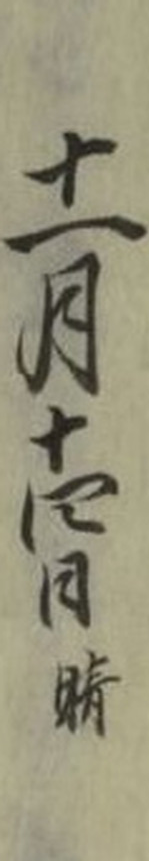十一月十四日晴
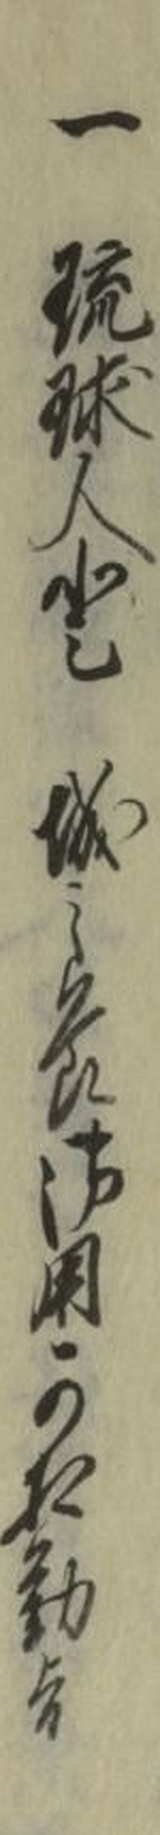一琉球人登城之節御用可相勤旨
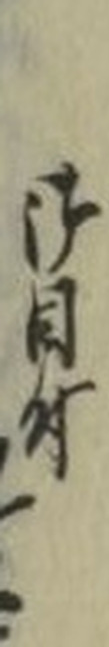御目付
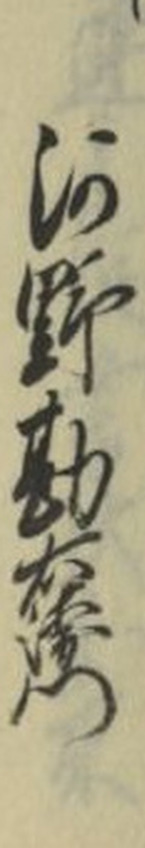河野勘右衛門
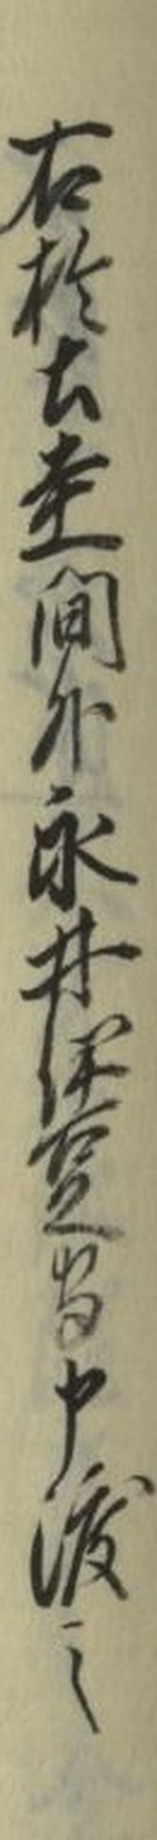右於土圭間外永井伊豆守申渡之
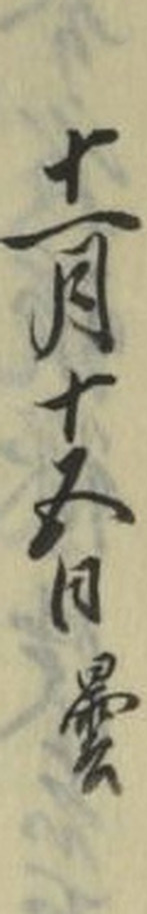十一月十五日曇
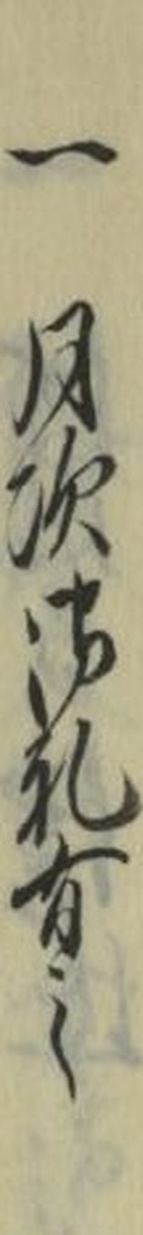一月次御礼有之
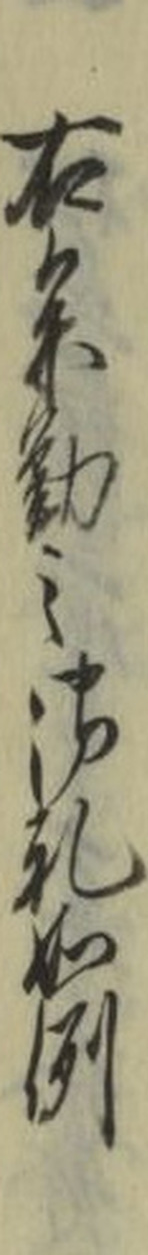右参勤之御礼如例

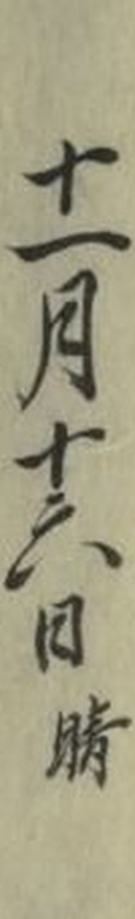十一月十六日晴
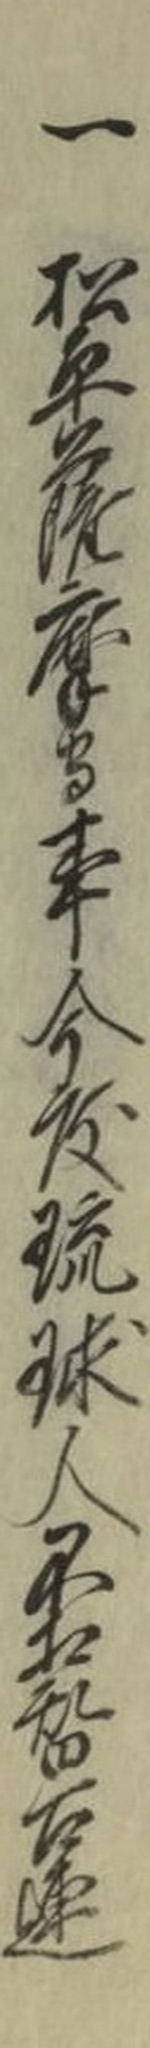一松平薩摩守事今度琉球人不相替召連
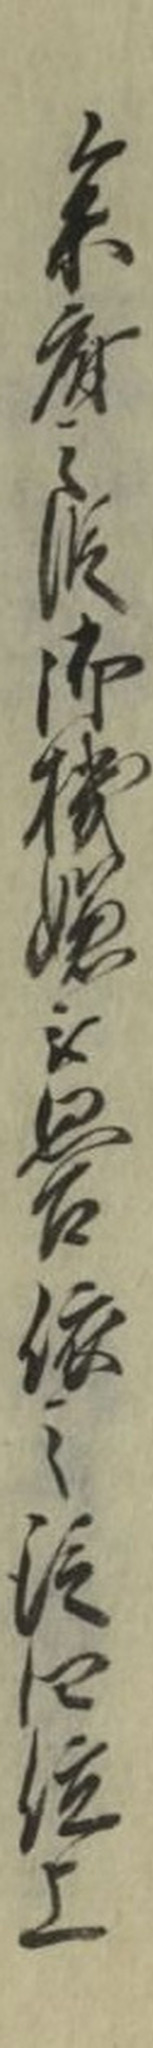参府之段御機嫌被思召依之従四位上
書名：琉球人参府記
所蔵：University of the Ryukyus Library
